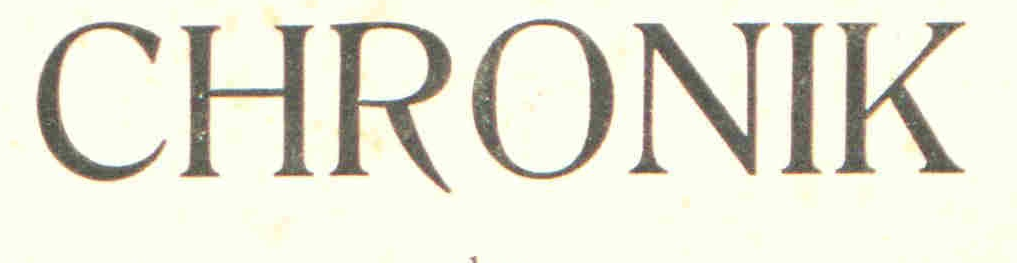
CHRONIK
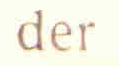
der
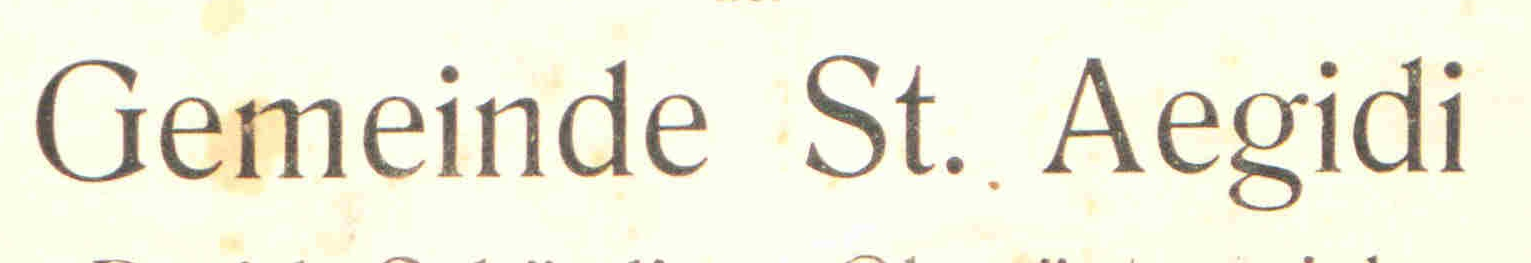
Gemeinde St. Aegidi
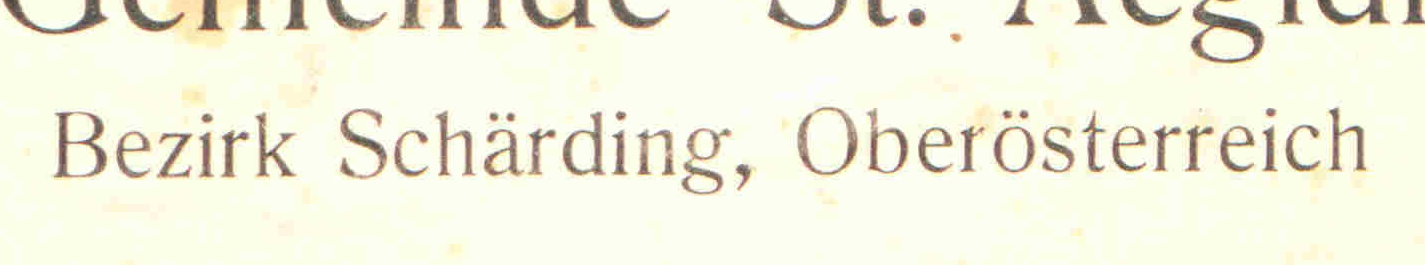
Bezirk Schärding, Oberösterreich
